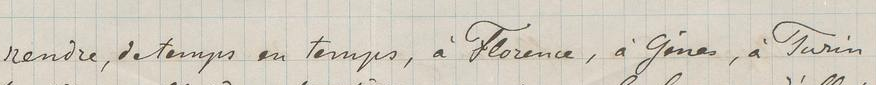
rendre, de temps en temps, à Florence, à Gênes, à Turin,
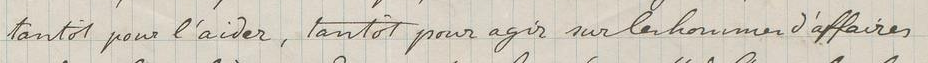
tantôt pour l'aider, tantôt pour agir sur les hommes d'affaires
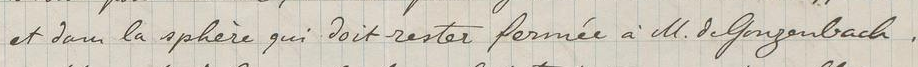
et dans la sphère qui doit rester fermée à M. de Gonzenbach.
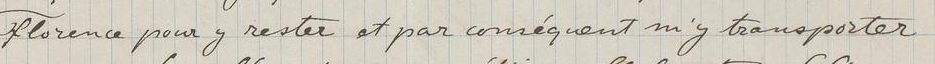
Florence pour y rester et par conséquent m'y transporter
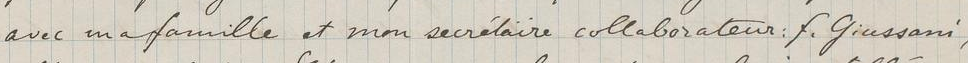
avec ma famille et mon secrétaire collaborateur: F. Giussani,
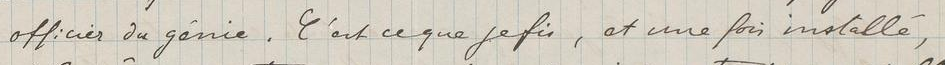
officier du génie. C'est ce que je fis, et une fois installé,
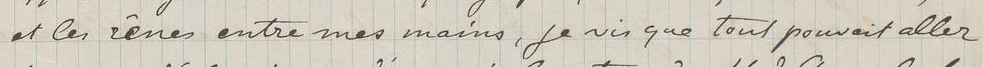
et les rênes entre mes mains, je vis que tout pouvait aller
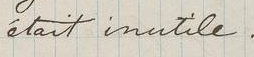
était inutile.
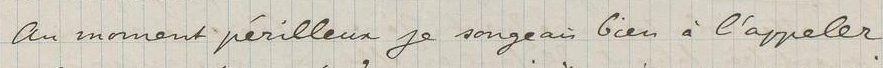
Au moment périlleux je songeais bien à l'appeler
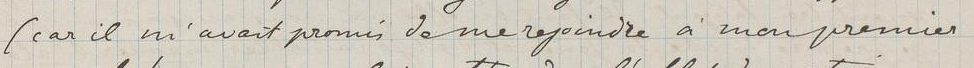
(car il m'avait promis de me rejoindre à mon premier
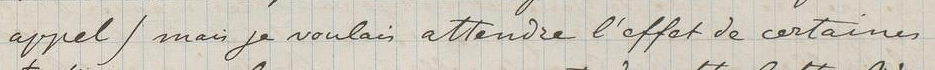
appel) mais je voulais attendre l'effet de certaines
